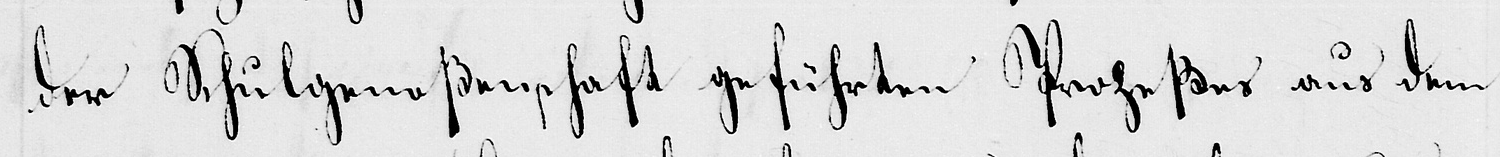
der Schulgenoßenschaft geführten Prozeßes aus dem
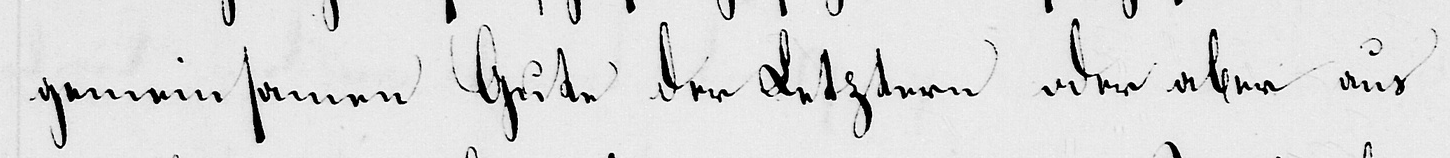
gemeinsamen Gute der Letztern oder aber aus
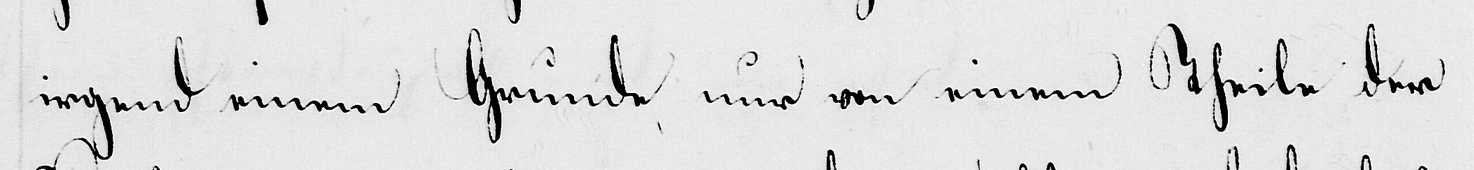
irgend einem Grunde nur von einem Theile der
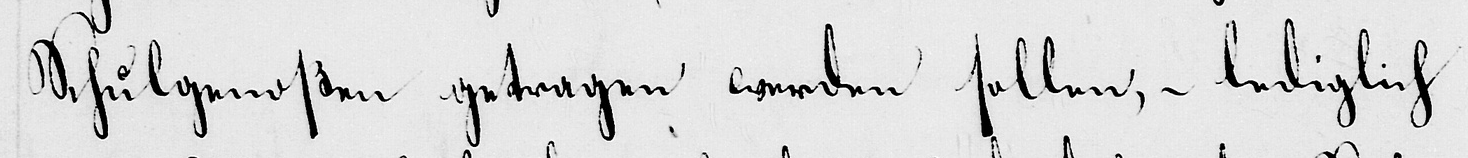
Schulgenoßen getragen worden sollen, – lediglich
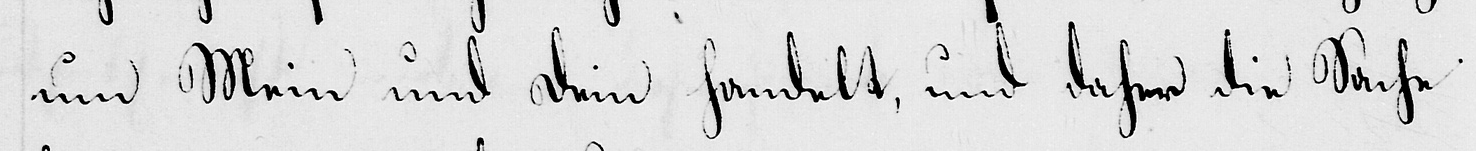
um Mein und Dein handelt, und daher die Sache
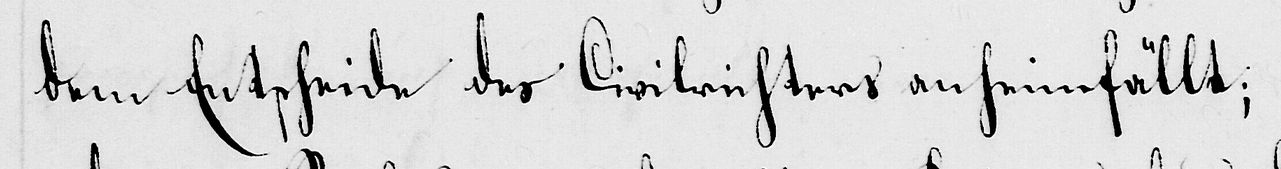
dem Entscheide des Civilrichters anheimfällt;
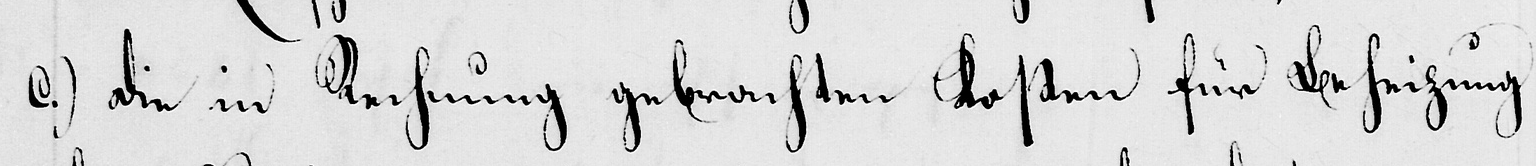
c.) die in Rechnung gebrachten Kosten für Beheizung
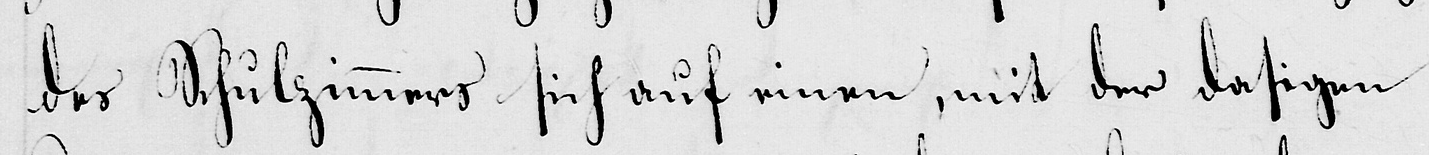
des Schulzimmers sich auf einen, mit der dasigen
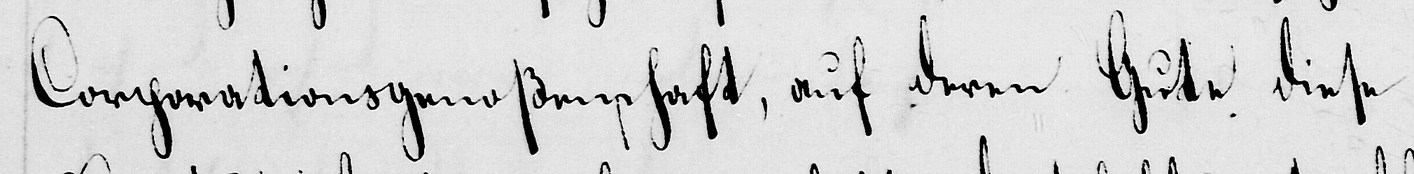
Corporationsgenoßenschaft, auf deren Gute diese
